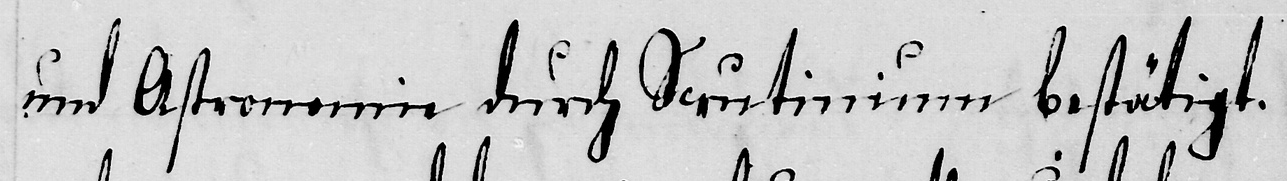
und Astronomie durch Scrutinium bestätigt.
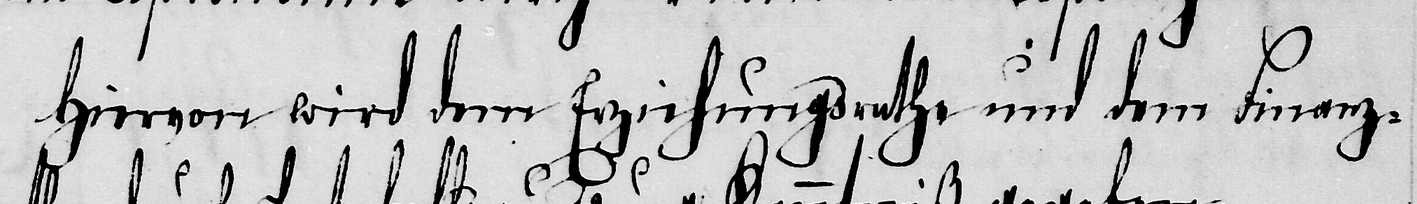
Hiervon wird dem Erziehungsrathe und dem Finanz¬
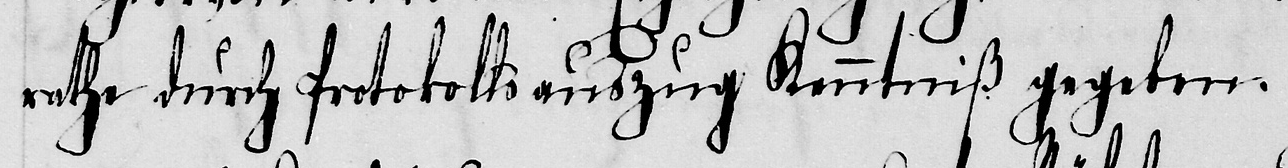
rathe durch Protokollsauszug Kenntniß gegeben.
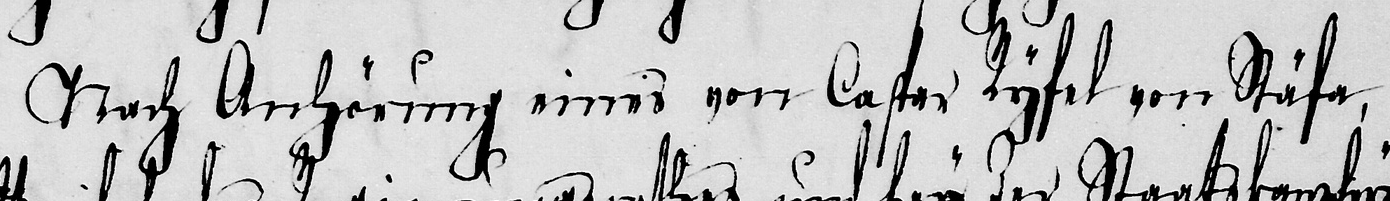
Nach Anhörung eines von Caspar Ryfel von Stäfa,
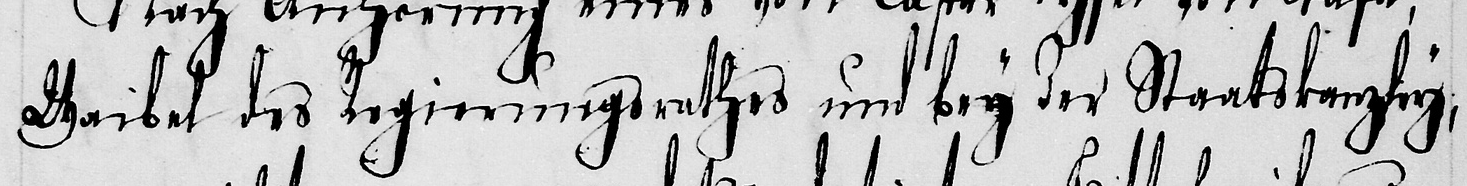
Waibel des Regierungsrathes und bey der Staatskanzley,
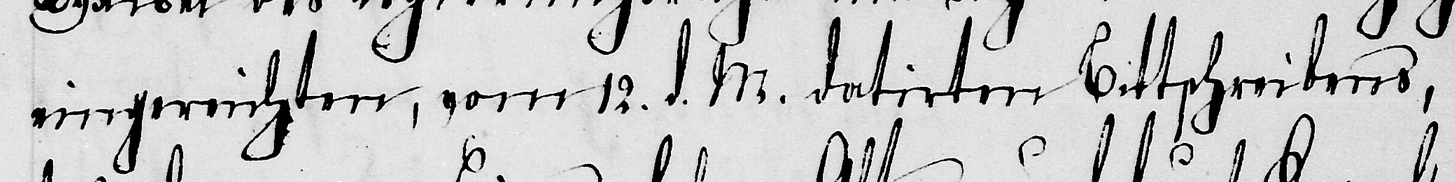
eingereichten, vom 12. d. M. datirten Bittschreibens,
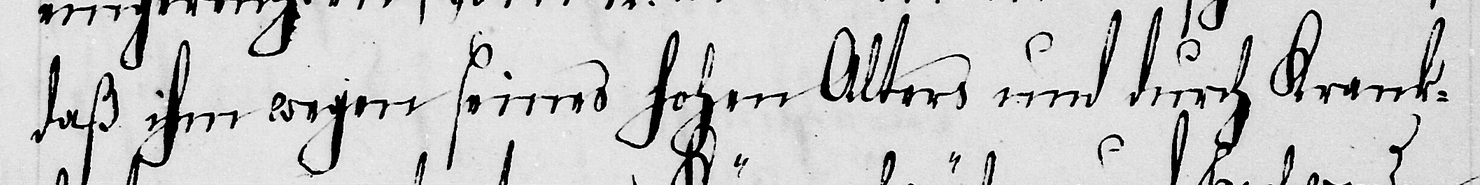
daß ihm wegen seines hohen Alters und durch Krank¬
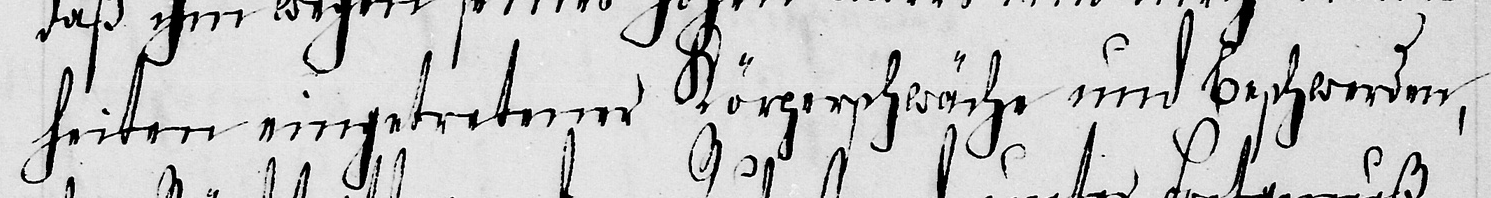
heiten eingetretener Körperschwäche und Beschwerden,
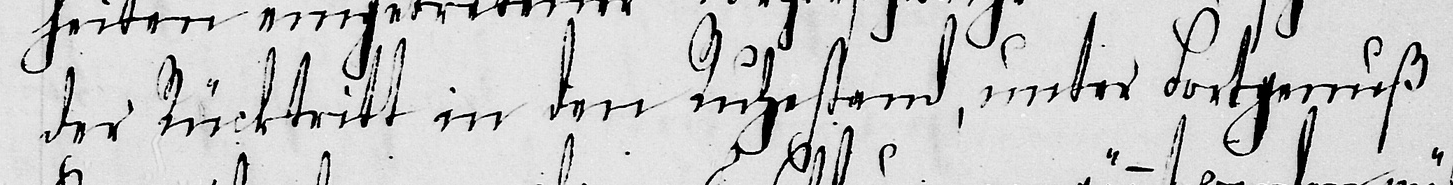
der Rücktritt in den Ruhestand, unter Fortgenuß
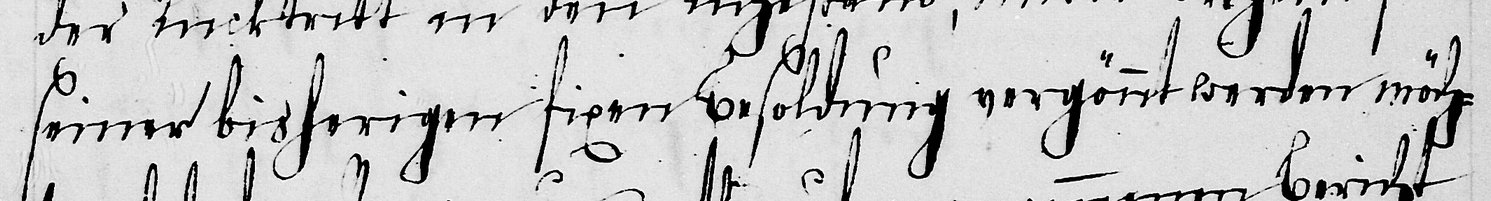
seiner bisherigen fixen Besoldung vergönnt werden möch¬
